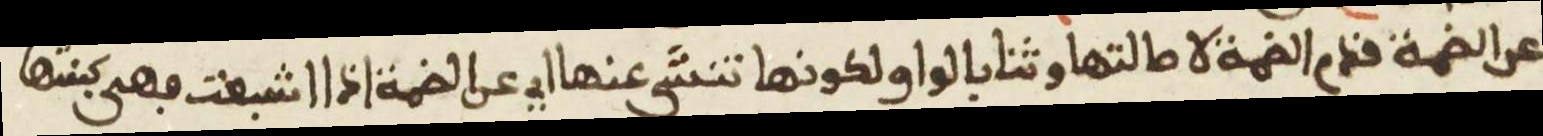عن الضمة قدم الضمة لاصالتها و ثنا بالواو لكونها تنشىها اي عن الضمة اذا اشبعت فهي كبنتها
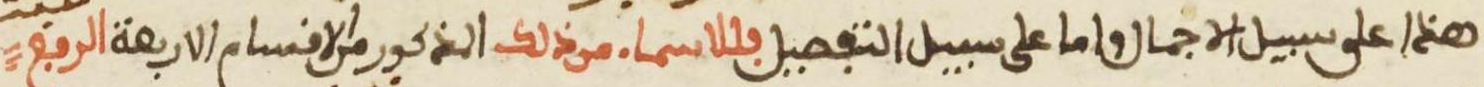هذا على سبيل الاجمال و اما على سبيل التفصيل فللاسماء من ذلك المذكور من الاقسام الاربعة الرفع
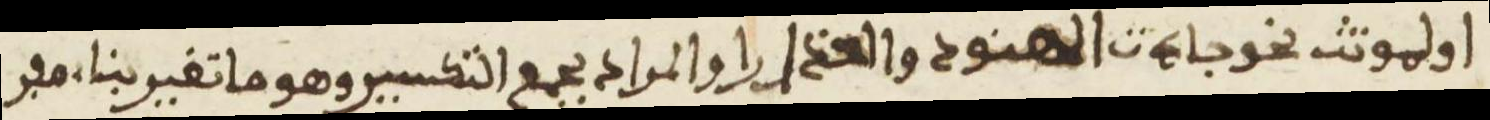او لمونث نحو جاءت الهنود و العذارا و المراد بجمع التكسير و هو ما تغير بناء مفر
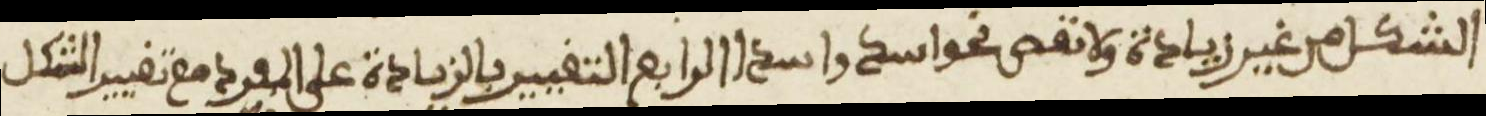الشكل من غير زيادة و لا نقص نحو اسد و اسدا الرابع التغيير بالزيادة على المفرد مع تغيير الشكل
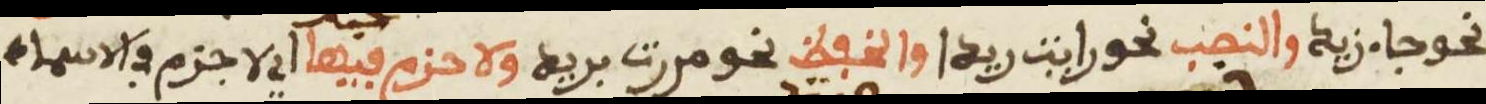نحو جاء زيد و النصب نحو رايت ريدا و الخفظ مررت بريد و لا حزم فيها اي لا جزم في الاسماء
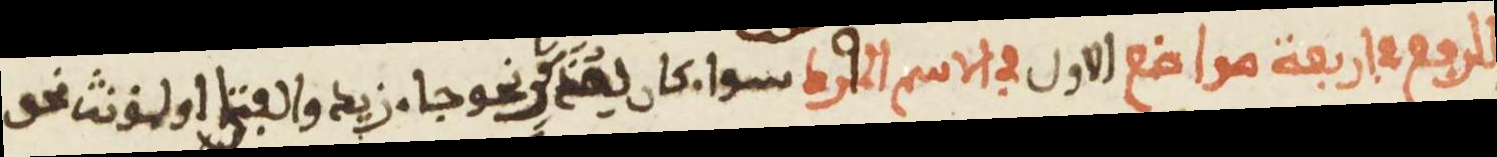للرفع في اربعة مواضع في الاسم المفرد سواء كان لمذكر نحو جاء زيد و الفتى او لمؤنث نحو
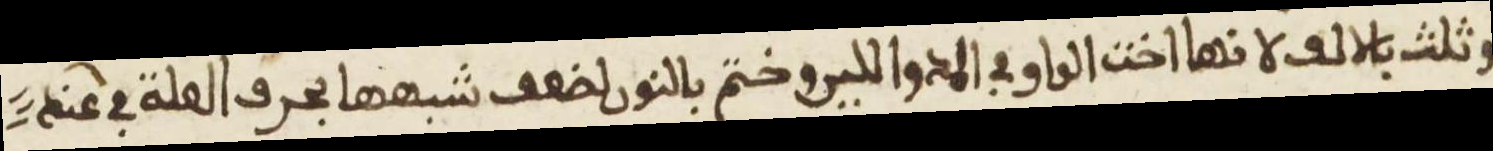و ثلث بالالف لانها اخت الواو في المد و اللين و ختم بالنون لضعف شبهها بحرف العلة في عند
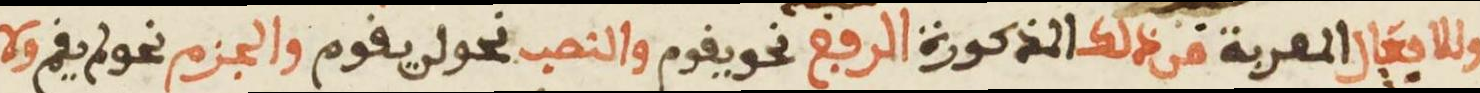و الافعال المعربة من ذلك المذكورة الرفع نحو يقوم و النصب نحو لن يقوم و الجزم نحو لم يفهم و لا
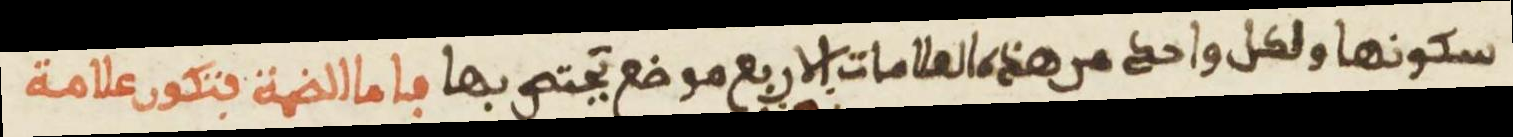سكونها و لكل واحد من هذه العلامات الاربع موضع يختص بها فاما الضمة فتكون علامة
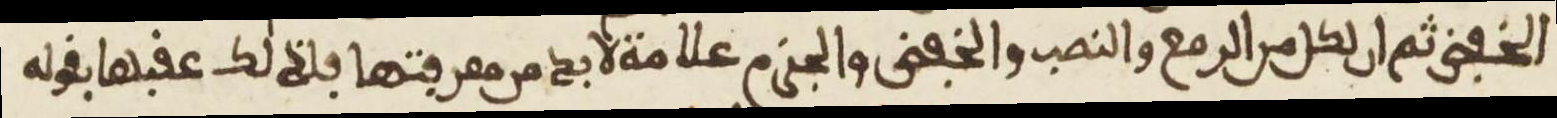الخفض ثم ان لكل من الرفع و النصب و الخفض و الجزم علامة لابد من معرفتها فلذلك عقبها بقوله
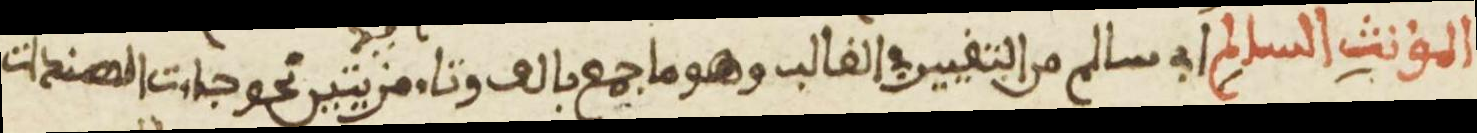المؤنث السالم اي سالم من التغيير في الغالب و هو ما جمع بالف و تاء مزيدتين نحو جاءت الهندات
